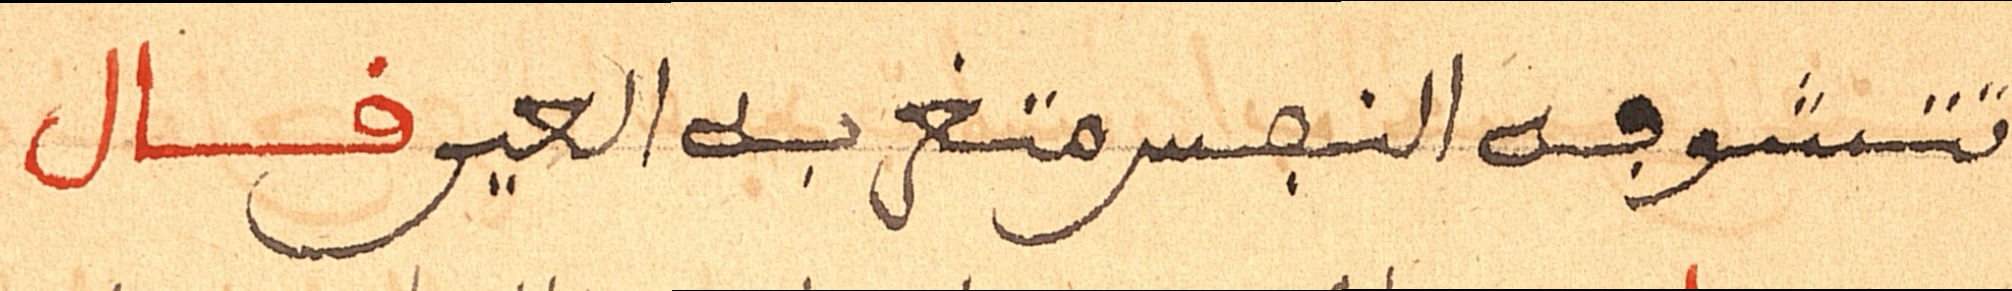تتشوفه النفس متغربه العين قال
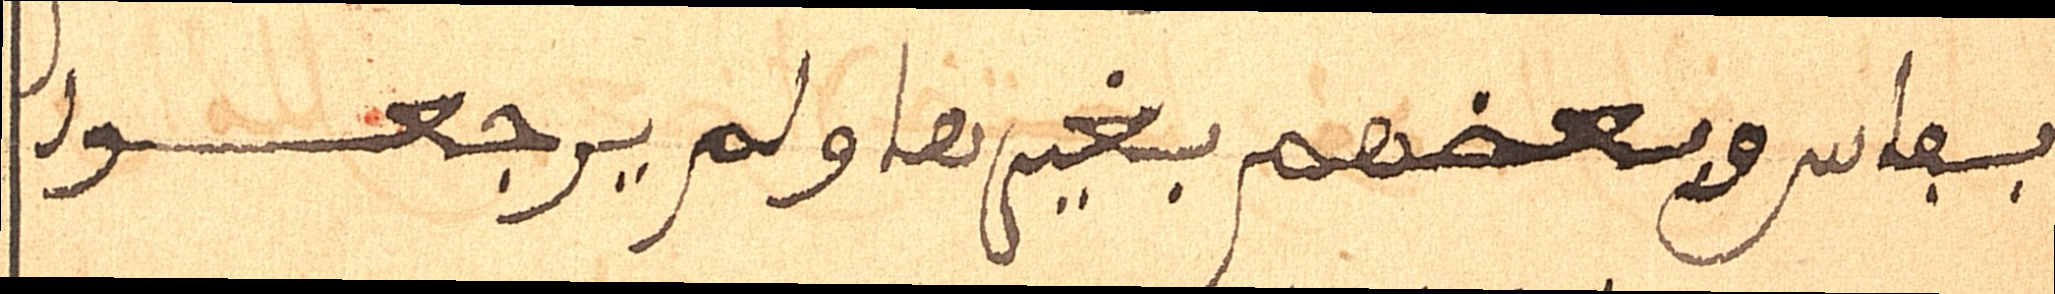بفاس وبعضهم بغيرها ولم يرجعوا
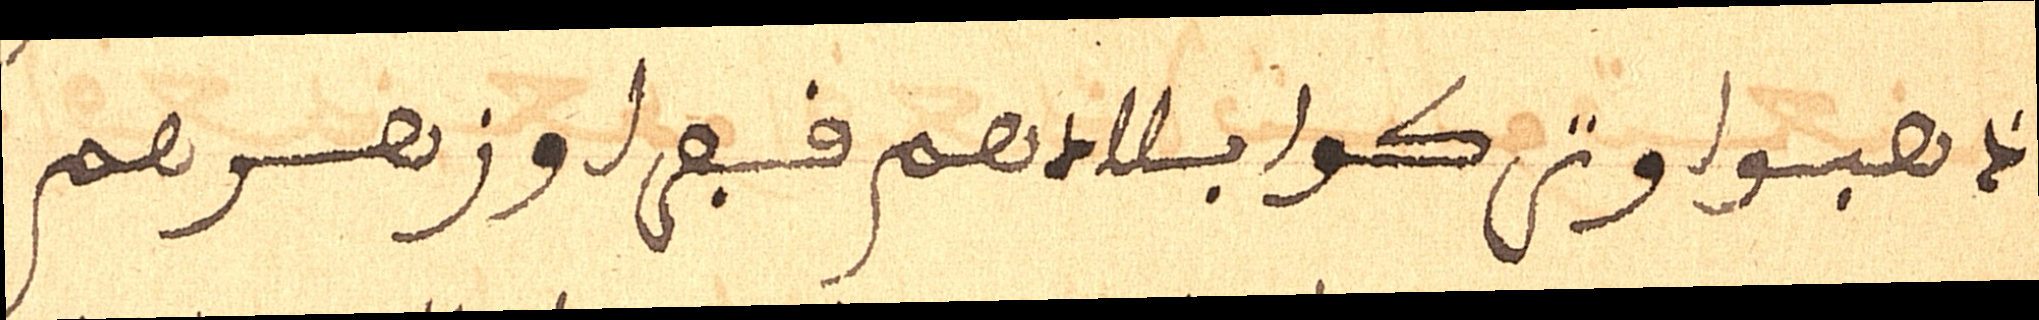ذهبوا وتركوا بلادهم قفراو زهرهم
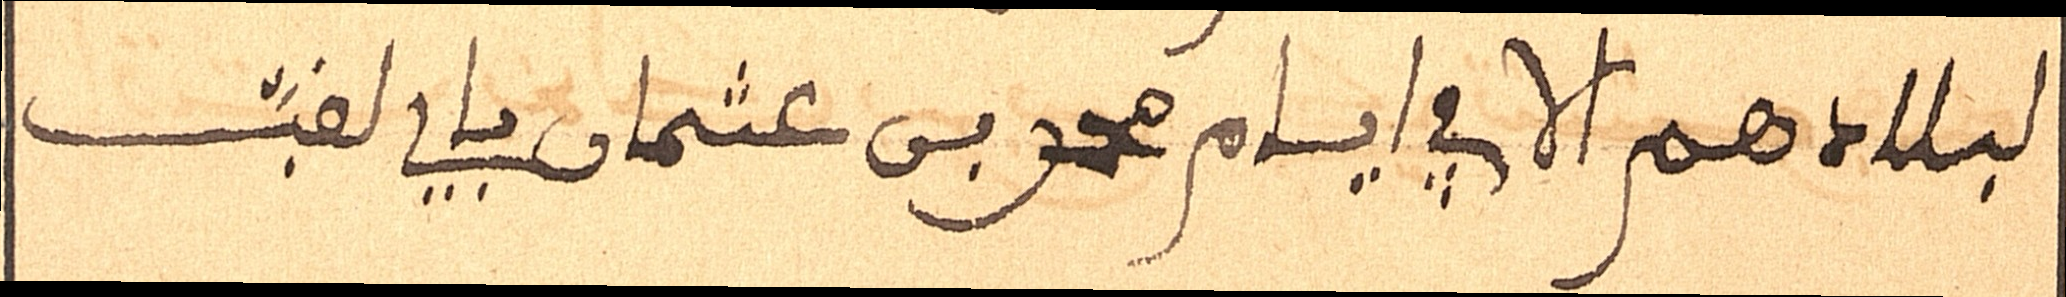لبلادهم الا في ايام محمد بن عثمان باي لقب
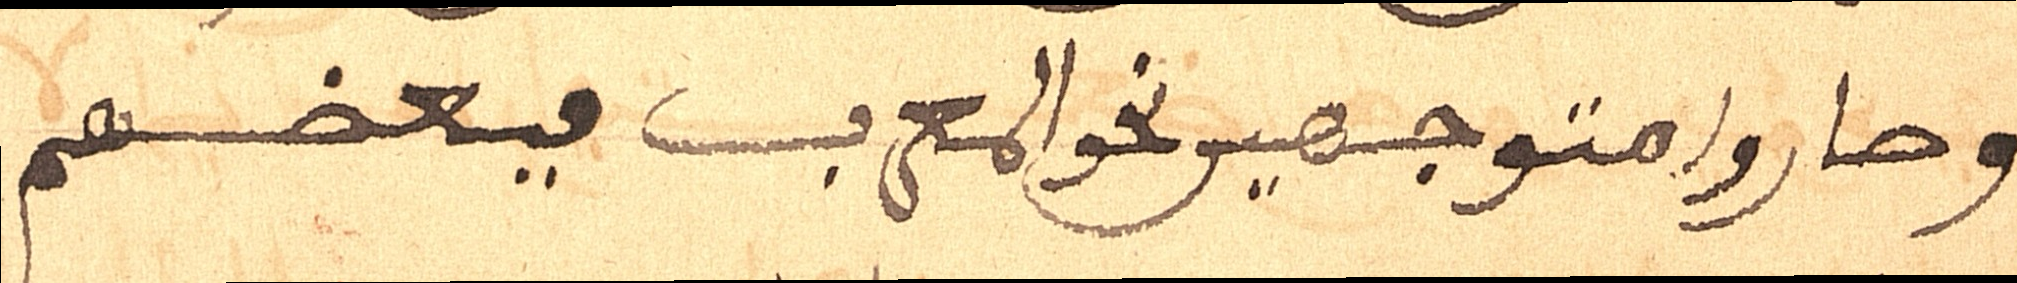وصاروا متوجهين نحو المعرب فبعضهم
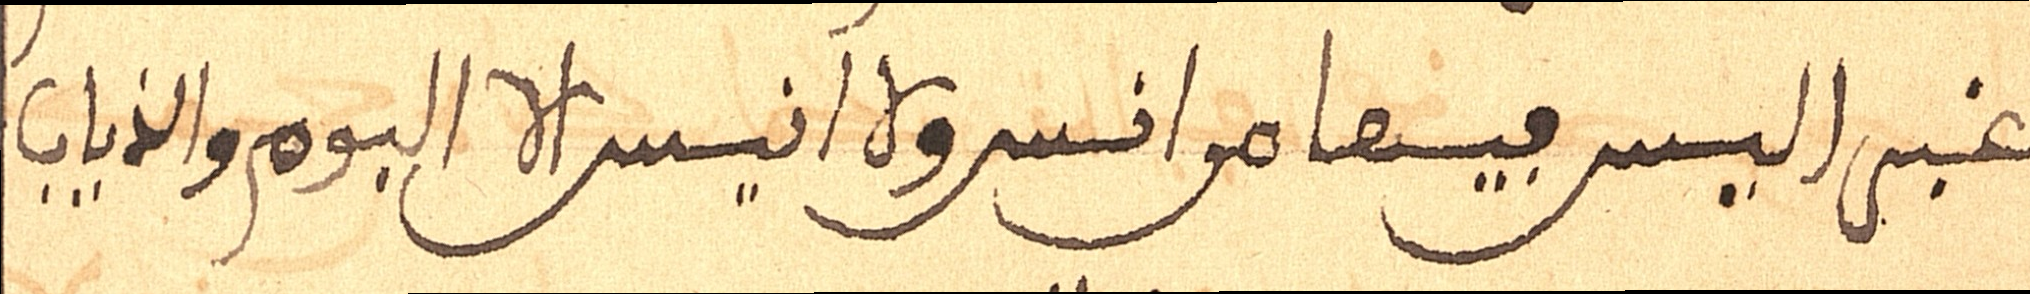غبرا ليس فيها من انس ولا انيس الا البوم والذياب
